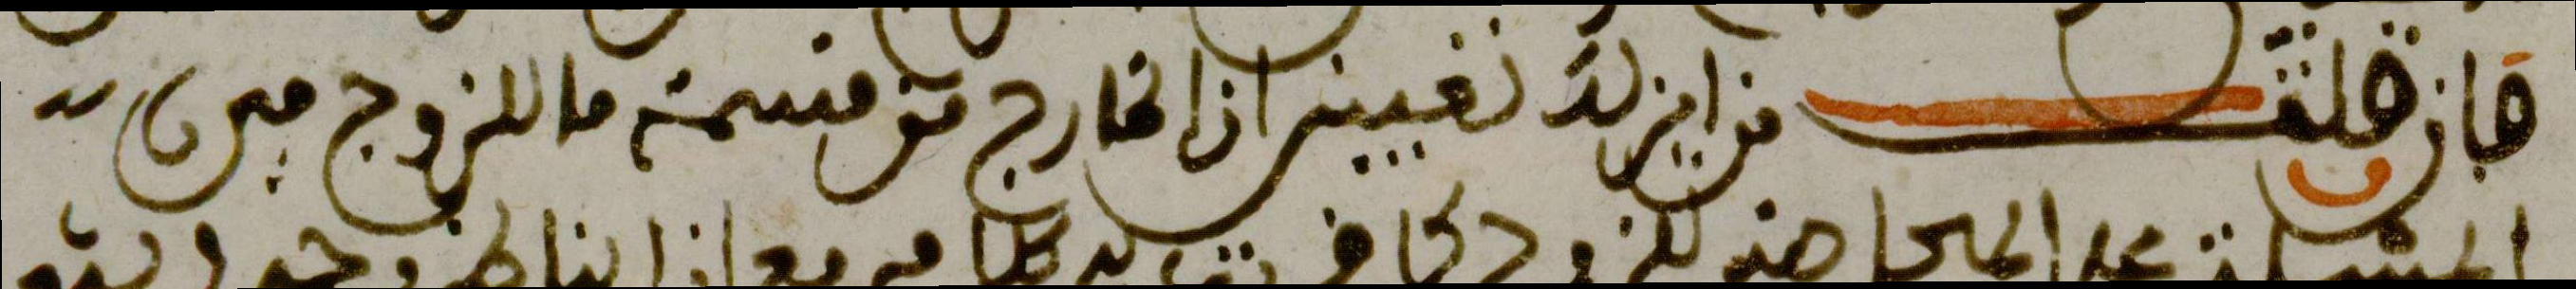فان قلت من اين لك تعيين ان الخارج من قسمة ما للزوج في
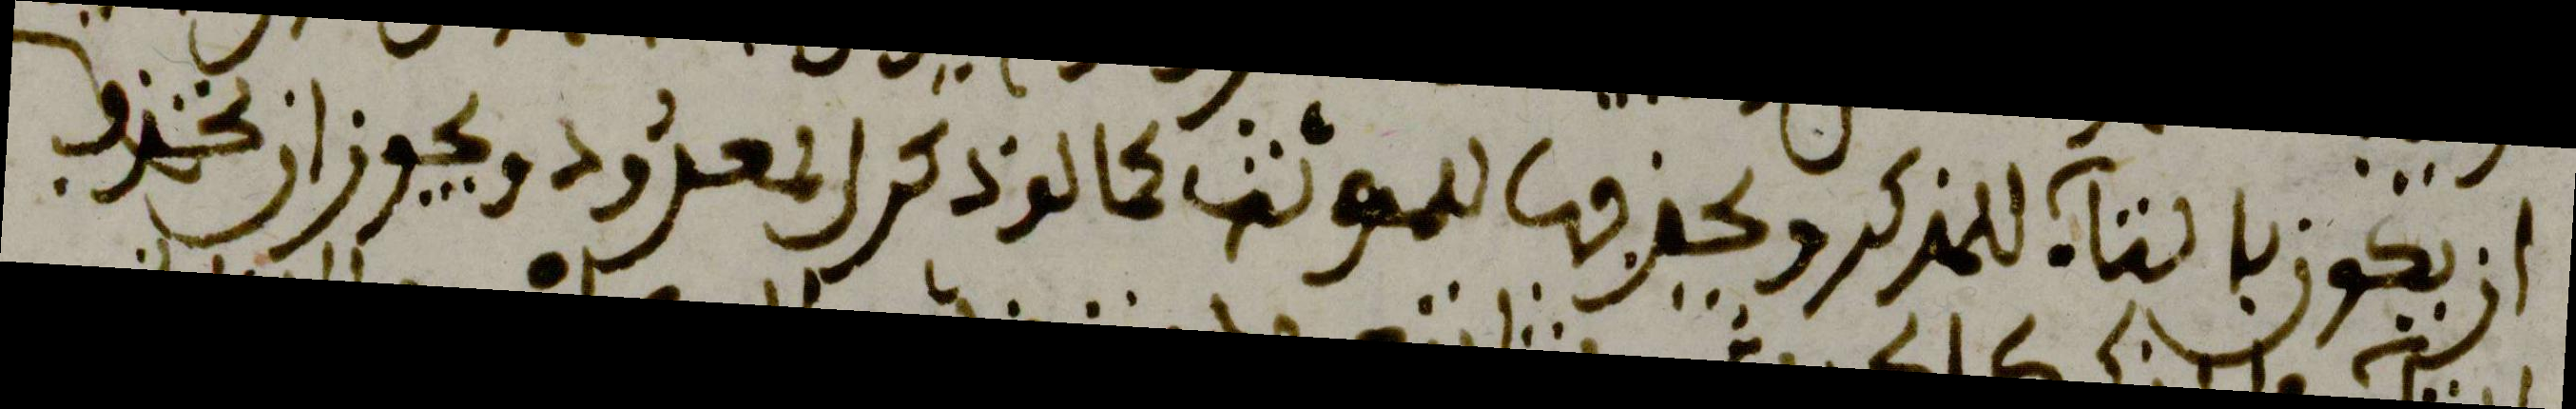ان يكون بالتاء للمذكر ويجذبها للمونث كمالو ذكر المعدود ويجوز ان تخذف
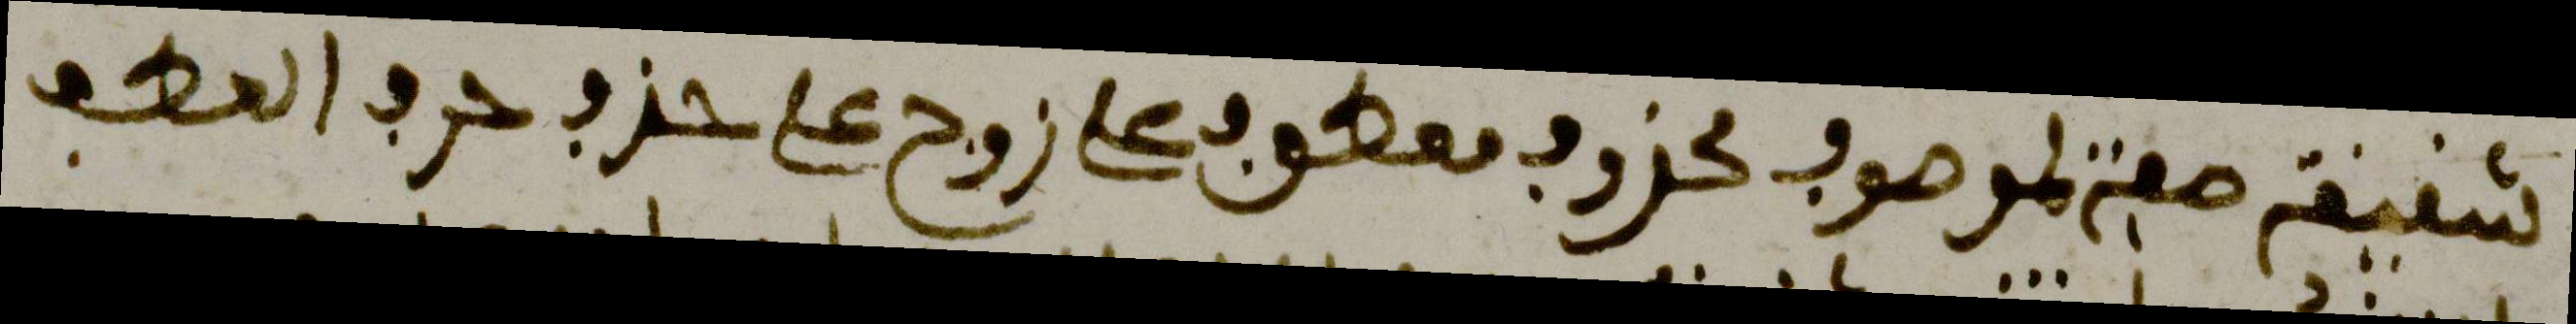شقيقة صفة لموصوف محذوف معطوف على زوج على حذف حرف العطف
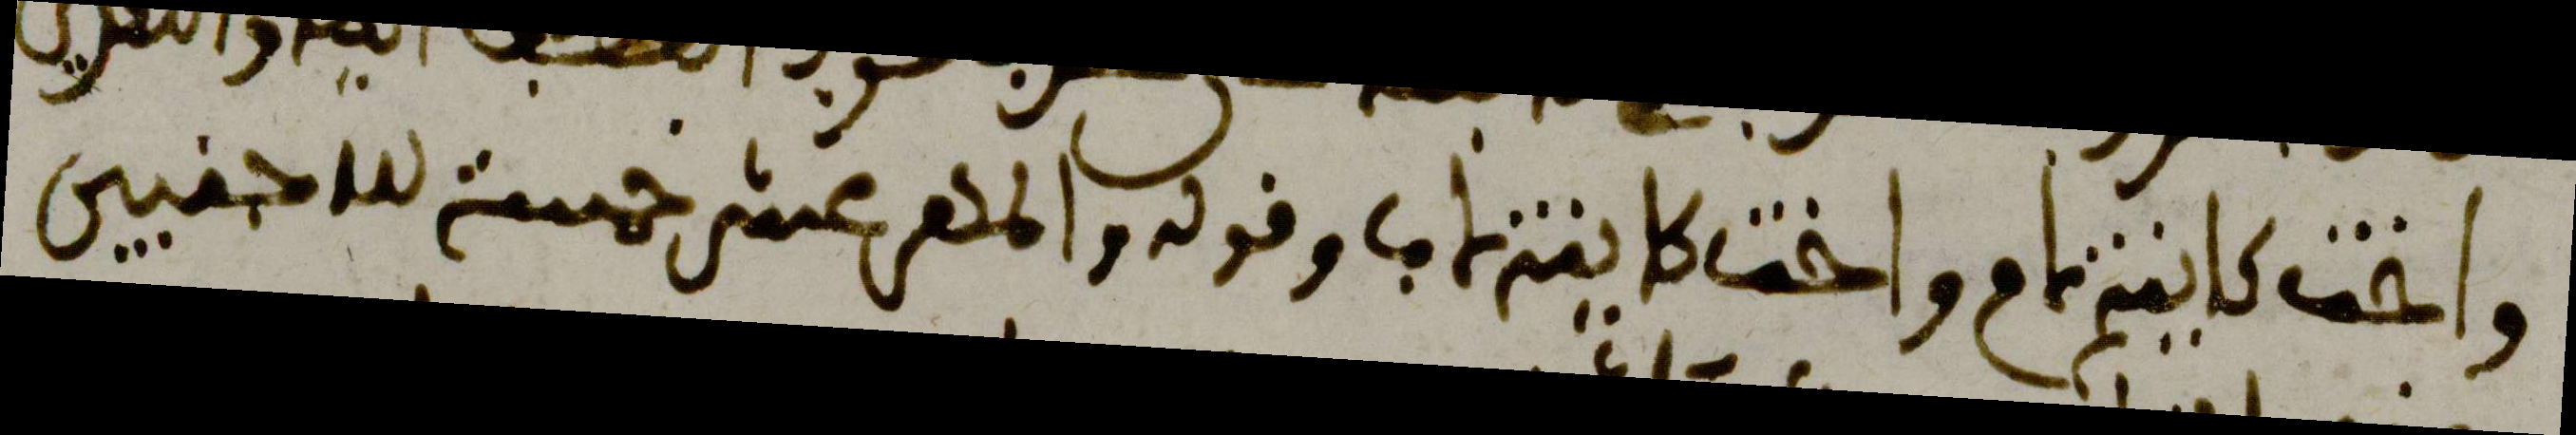واخت كاينة لام واخت كاينة لاب وقوله والمهر عشر خمسة للاجنبي
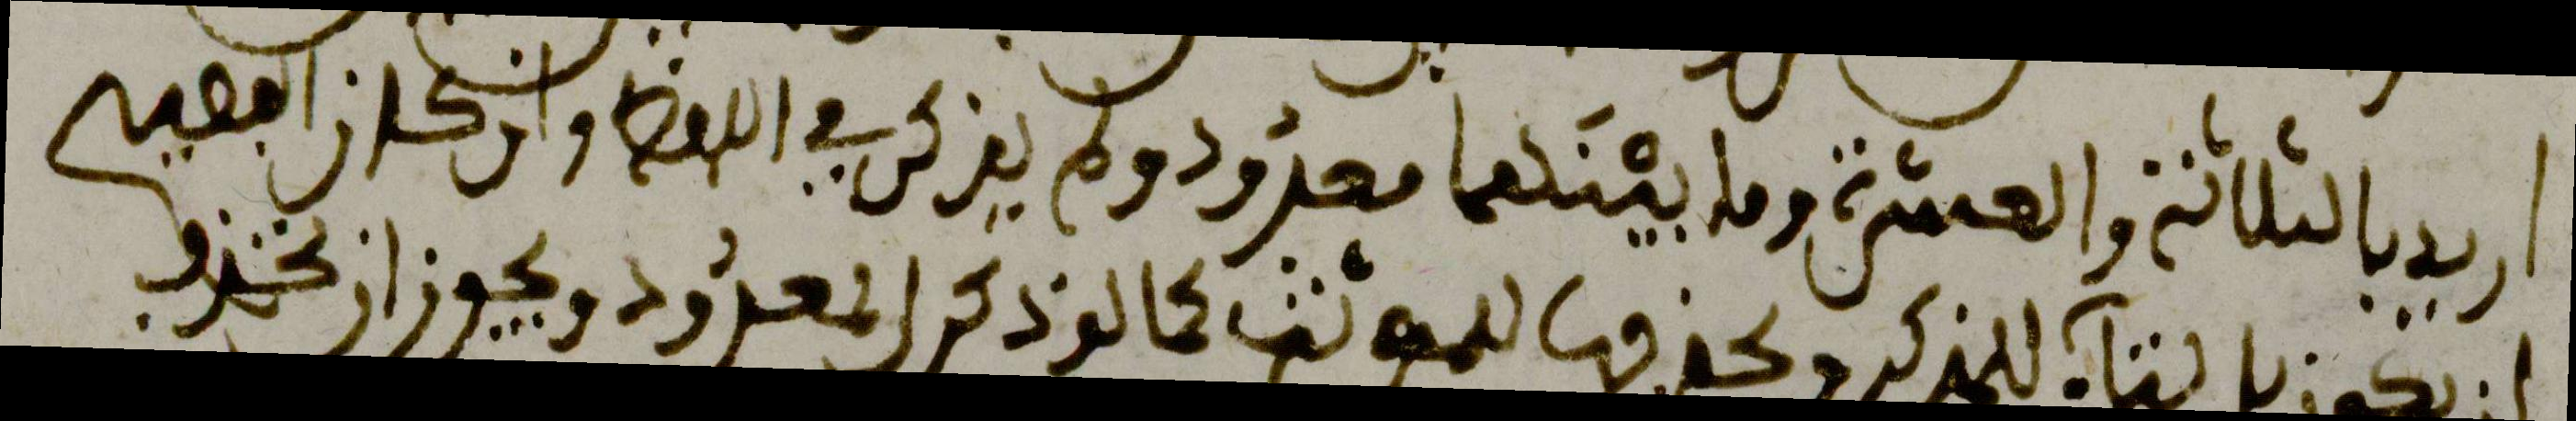اريد بالثلاثة والعشرة وما بينهما معدود ولم يذكر في اللفظ وان كان الفصيح
